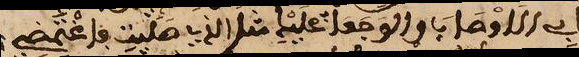ابي الاوصاب والوجعا عليك مثل الذي صليت فاغتمضي
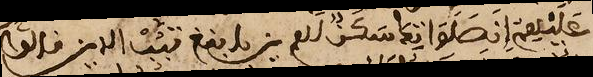عليهم ان صلواتك سكن لهم ين بابنغ تبب الدين قالوا
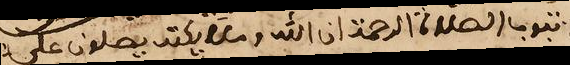تبوب الصلاة الرحمة ان الله وملايكته يصلون على
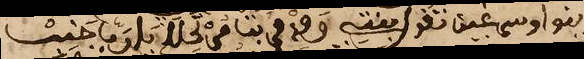ينوا اوسرغين تقول بنتي وقد قربت مرتحلا يارب جنب
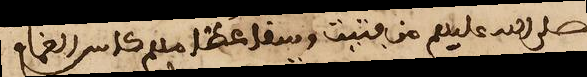صلى الله عليهم من فتيت وسقا عظامهم كاس الغمام
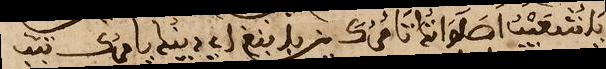ياشعيب اصلواتك تامرك ين بابنغ اي دينك يامرك تبب
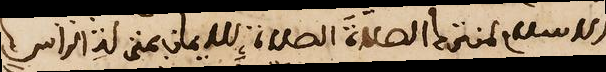الإسلام لمن ترك الصلاة الصلاة للايمان بمنزلة الرأس
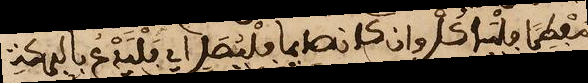مفطرا فلياكل وان كان صايما فليصل اي فليدع بالبركة
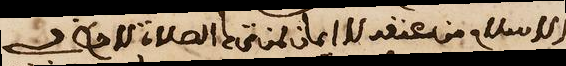الإسلام من عنقه لا ايمان لمن ترك الصلاة لاحظ في
